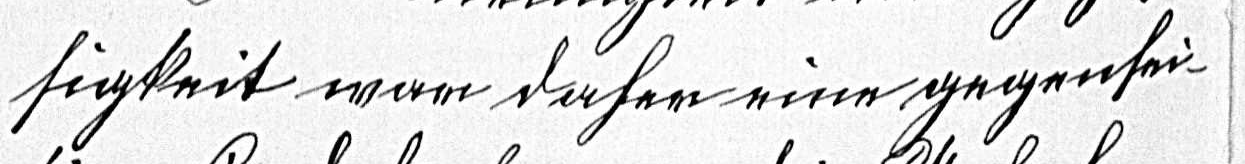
sigkeit war daher eine gegensei¬
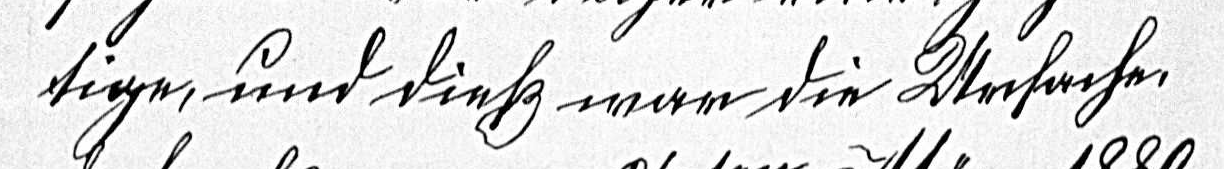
tige, und dieß war die Ursache,
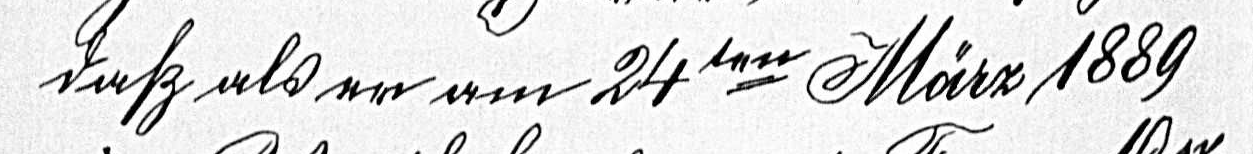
daß als er am 24ten März 1889
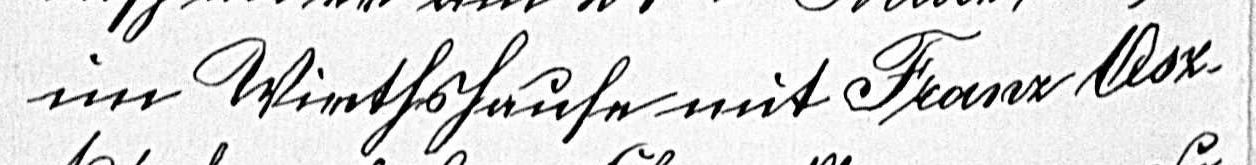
im Wirtshause mit Franz Osz¬
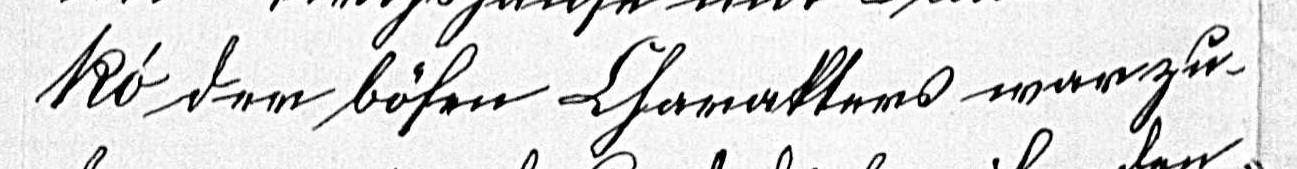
kó, der bösen Charakters war, zu¬
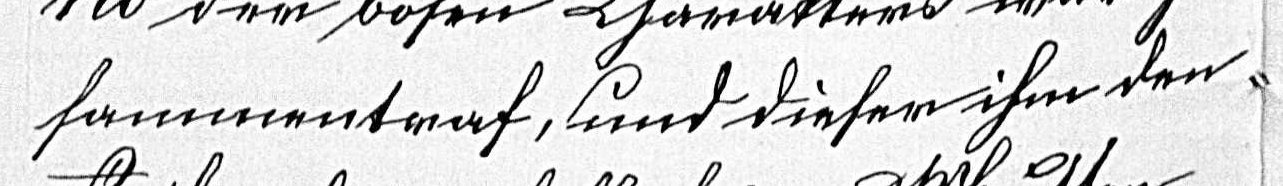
sammentraf, und dieser ihm den
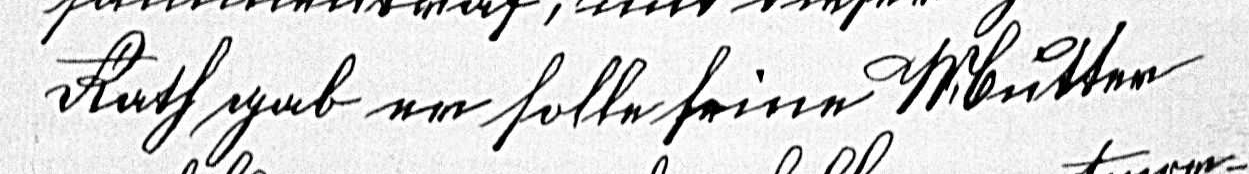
Rath gab er solle seine Mutter
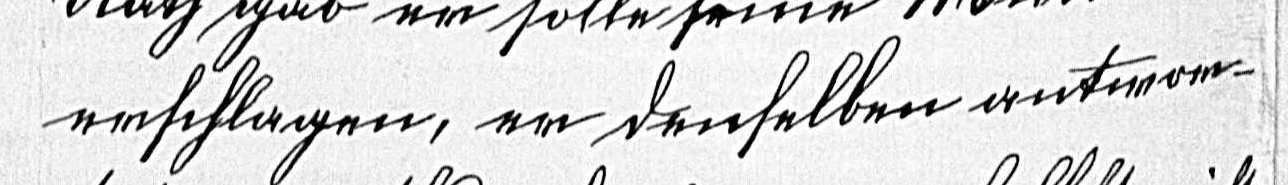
erschlagen, er denselben antwor¬
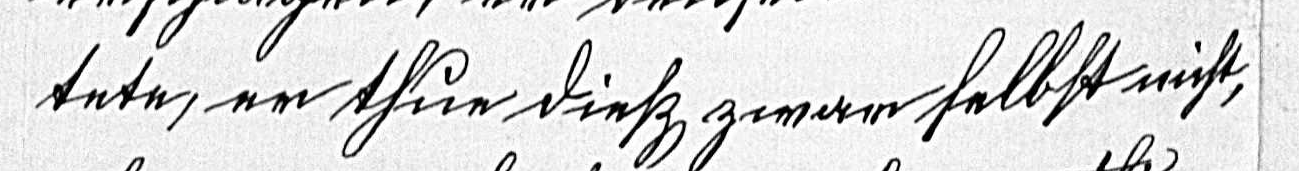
tete, er thue dieß zwar selbst nicht
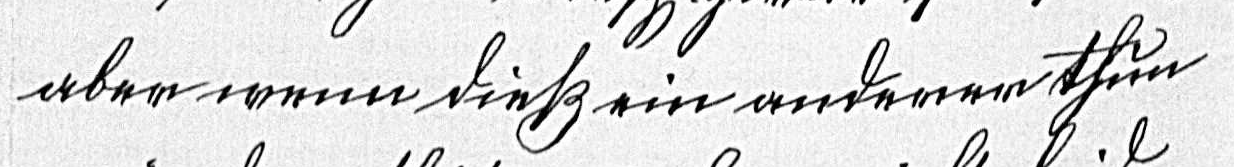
aber wenn dieß ein anderer thun
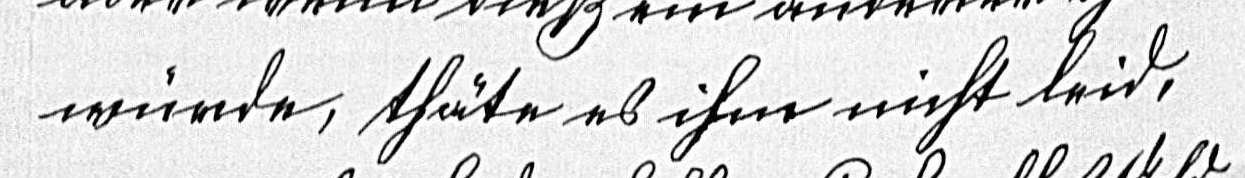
würde, thäte es ihm nicht leid,
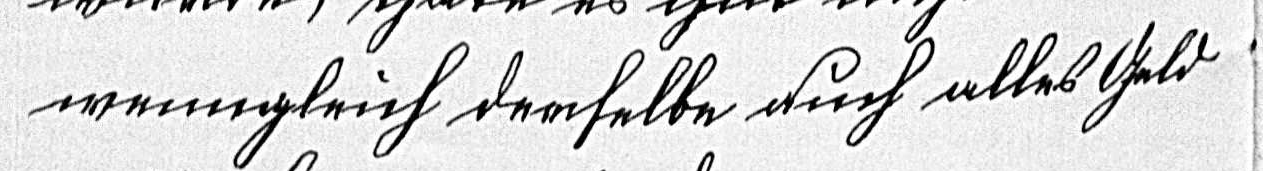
wenngleich derselbe auch alles Geld
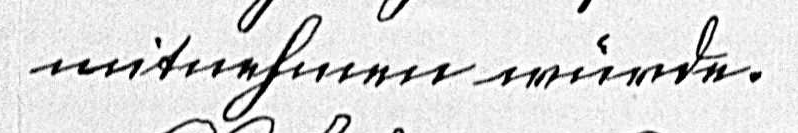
mitnehmen würde.
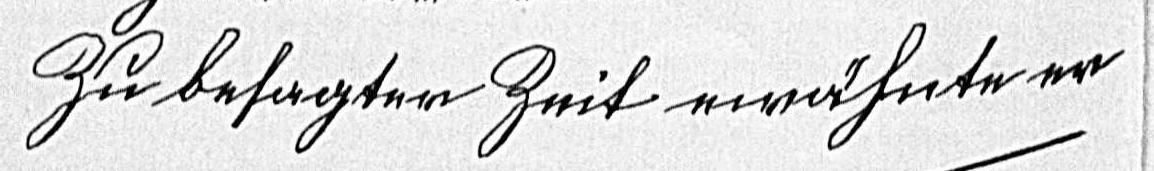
Zu besagten Zeit erwähnte er
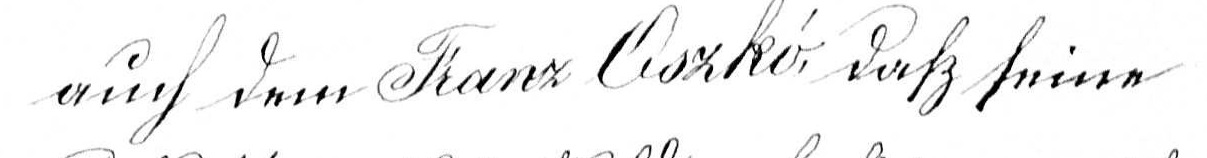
auch dem Franz Oszkó, daß seine
